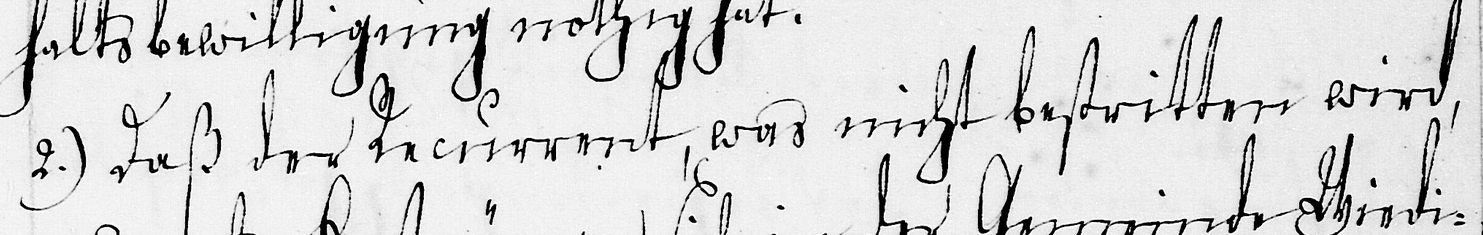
2.) Daß der Recurrent, was nicht bestritten wird,
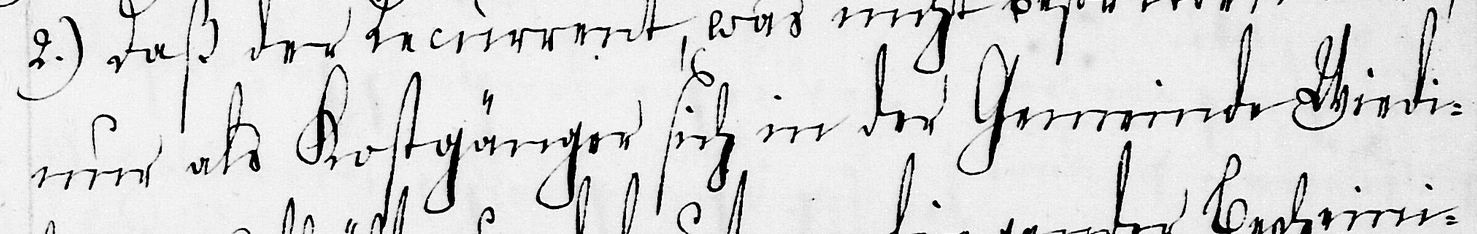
nur als Kostgänger sich in der Gemeinde Wiedi¬
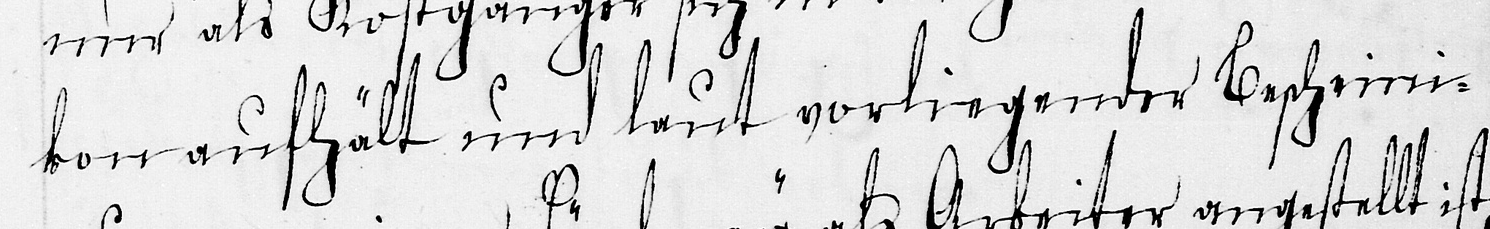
kon aufhält und laut vorliegender Bescheini¬
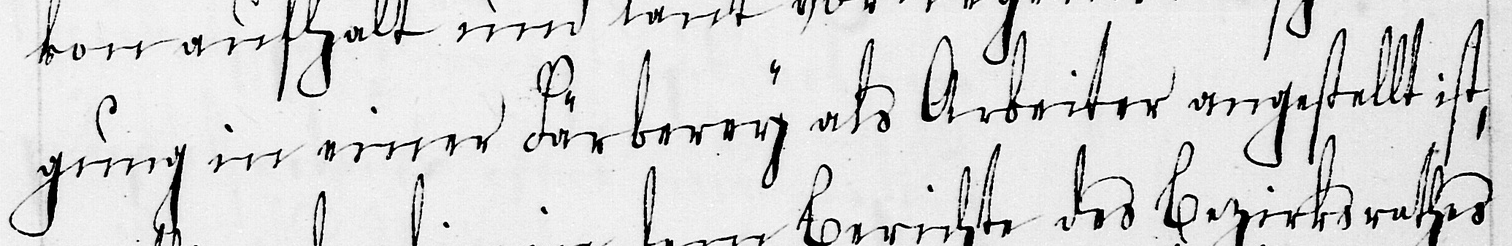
gung in einer Färberey als Arbeiter angestellt
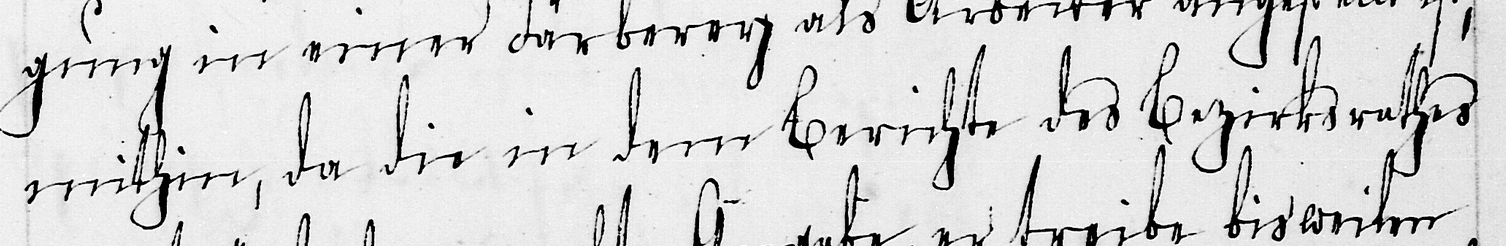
mithin, da die in dem Berichte des Bezirksrathes
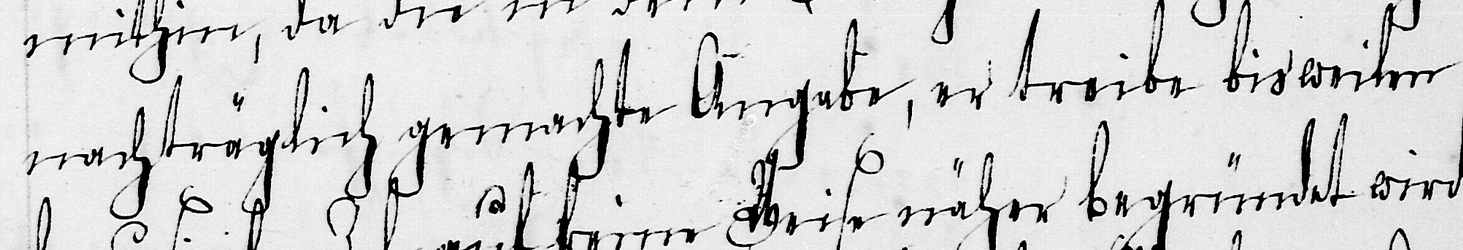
nachträglich gemachte Angabe, er treibe bisweilen
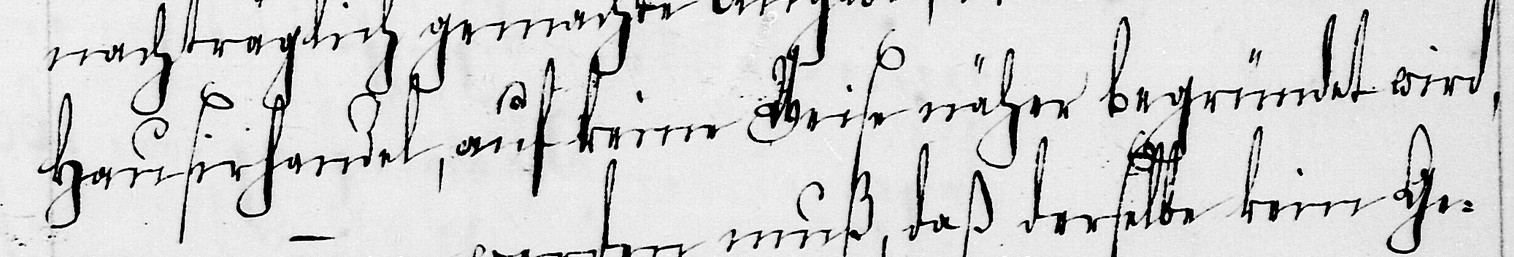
Hausirhandel, auf keine Weise näher begründet wird,
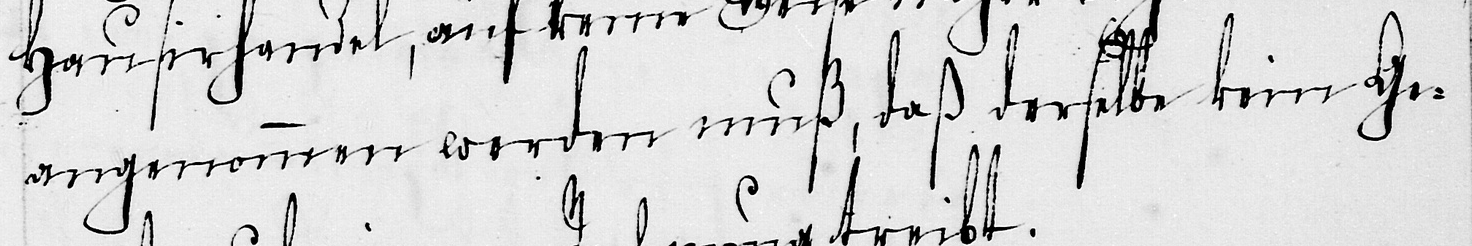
angenommen werden muß, daß derselbe kein Ge¬
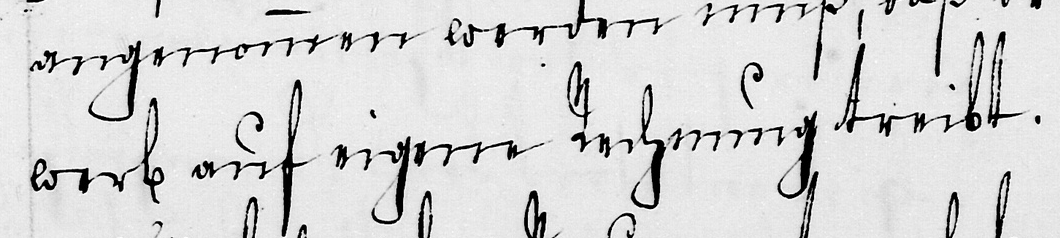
werb auf eigene Rechnung treibt.
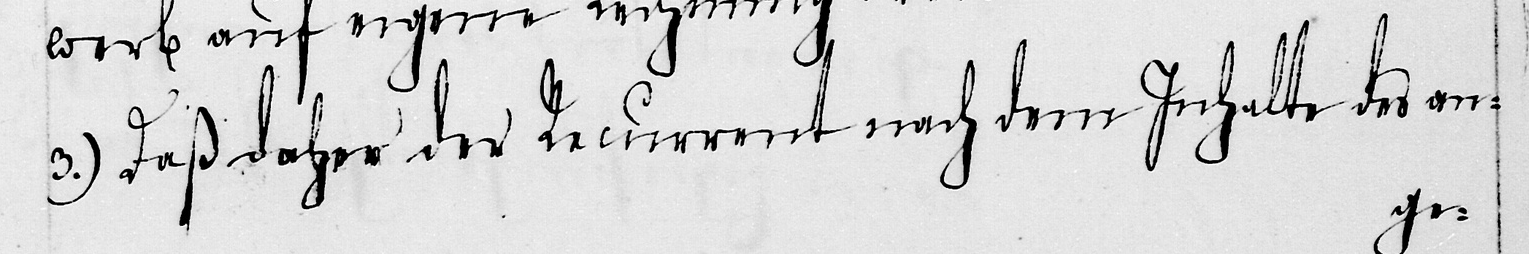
3.) Daß daher der Recurrent nach dem Inhalte des an-
